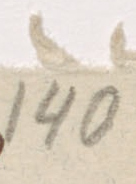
126.
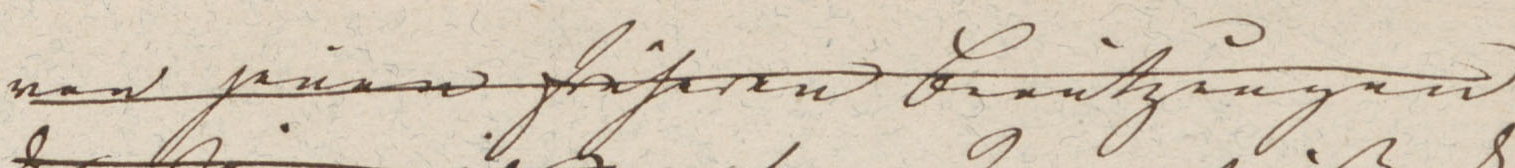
von seinen früheren Benutzungen
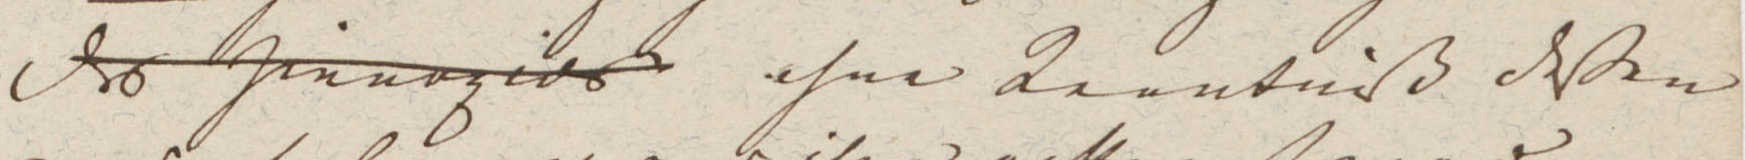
des Zinnoxids ohne Kenntniss dessen
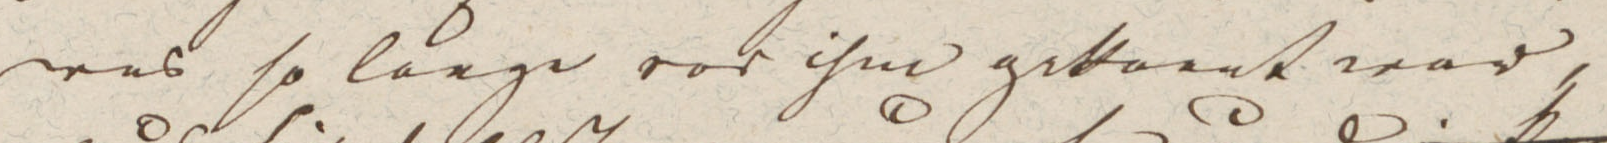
was so lange vor ihm gekannt war,
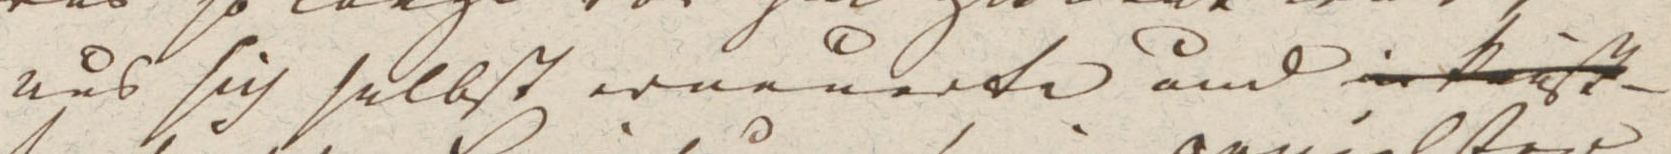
aus sich selbst erneuerte und in kunst-
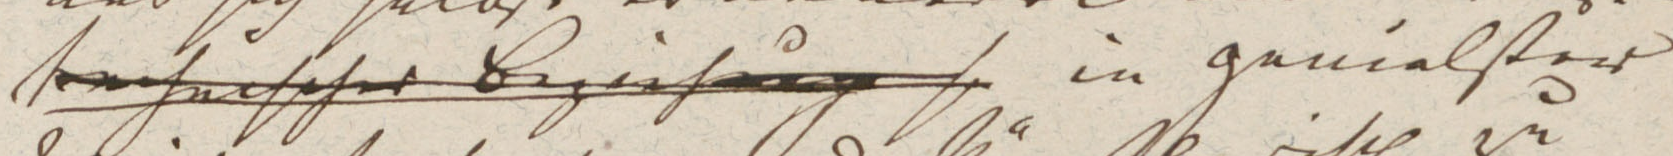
technischer Beziehung so in genialster
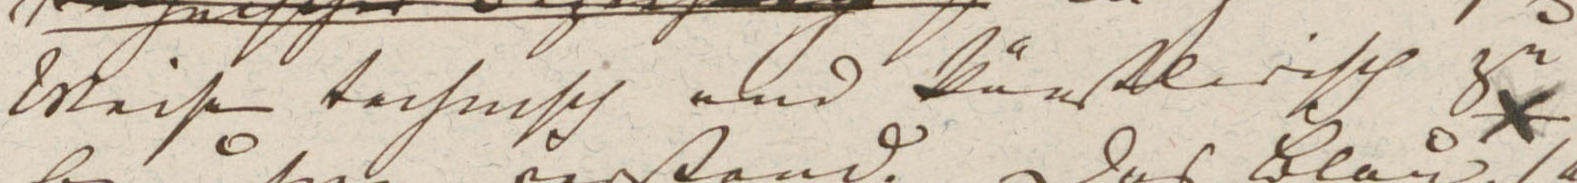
Weise technisch und künstlerisch zu
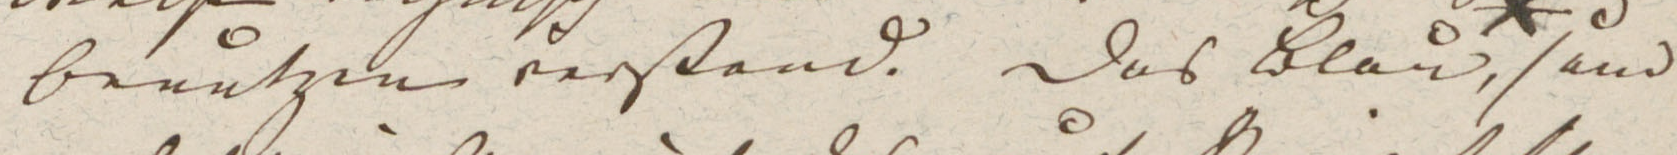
benutzen verstand. Das Blau, % und
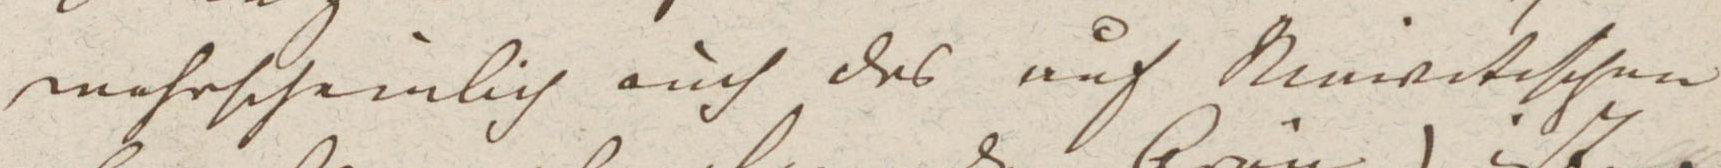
wahrscheinlich auch das auf Ninivitischen
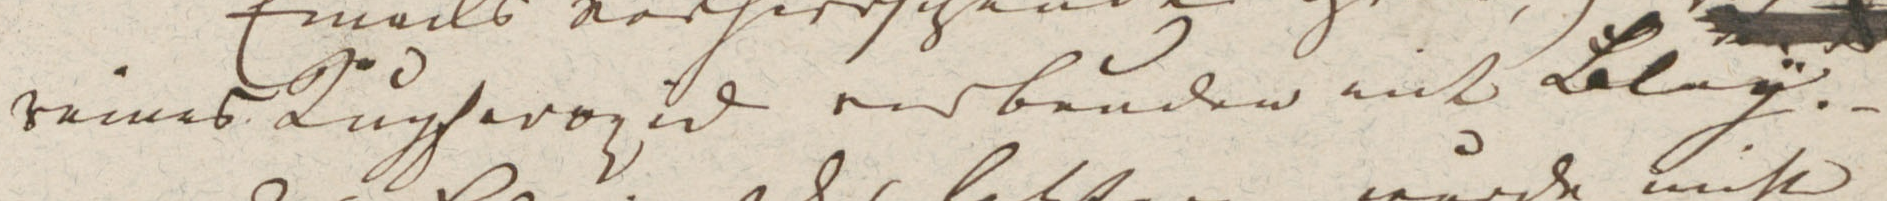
reines Kupferoxid verbunden mit Bley.
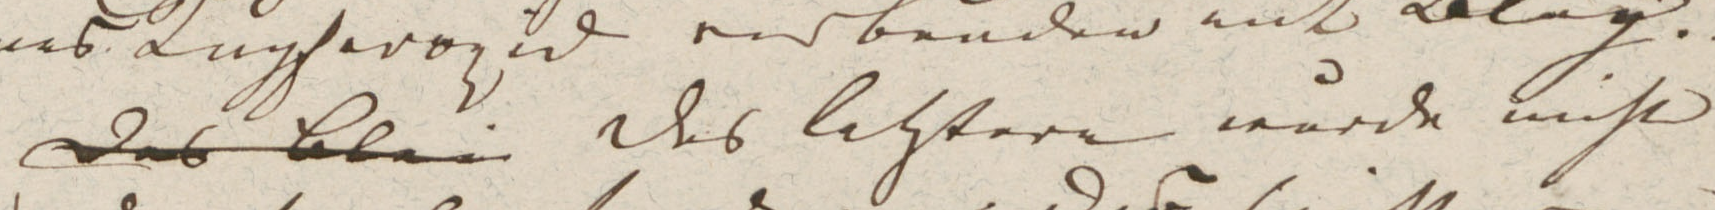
Das Blei Das letztere wurde nicht
